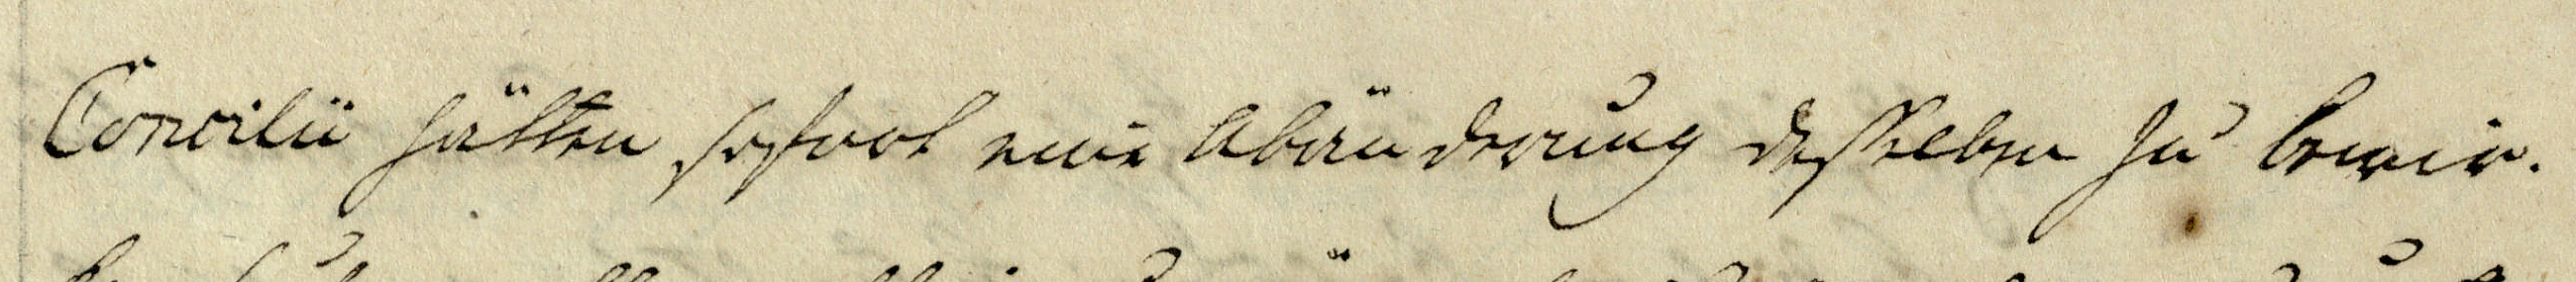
Concilii hätten sofort eine Abänderung desselben zu bewir¬
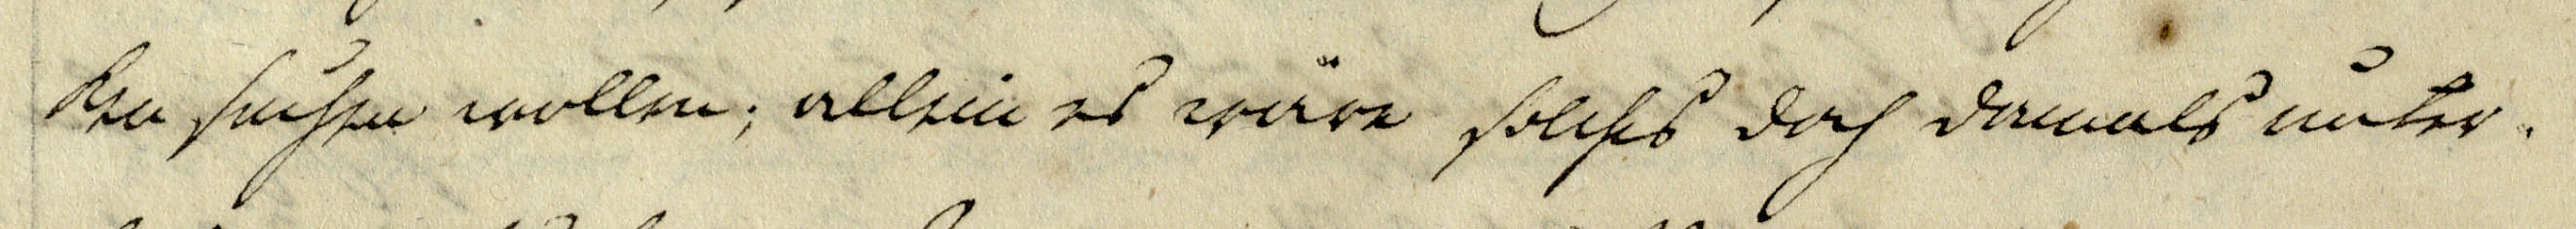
ken suchen wollen; allein es wäre solches doch damals unter¬
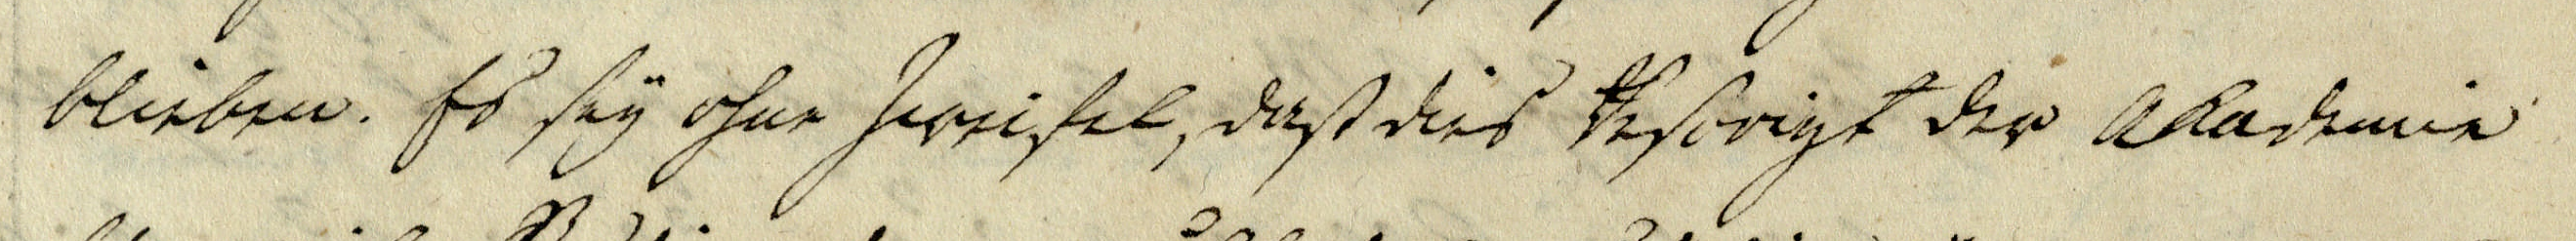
blieben. Es seÿ ohne Zweifel, daß dies Rescript der Akademie
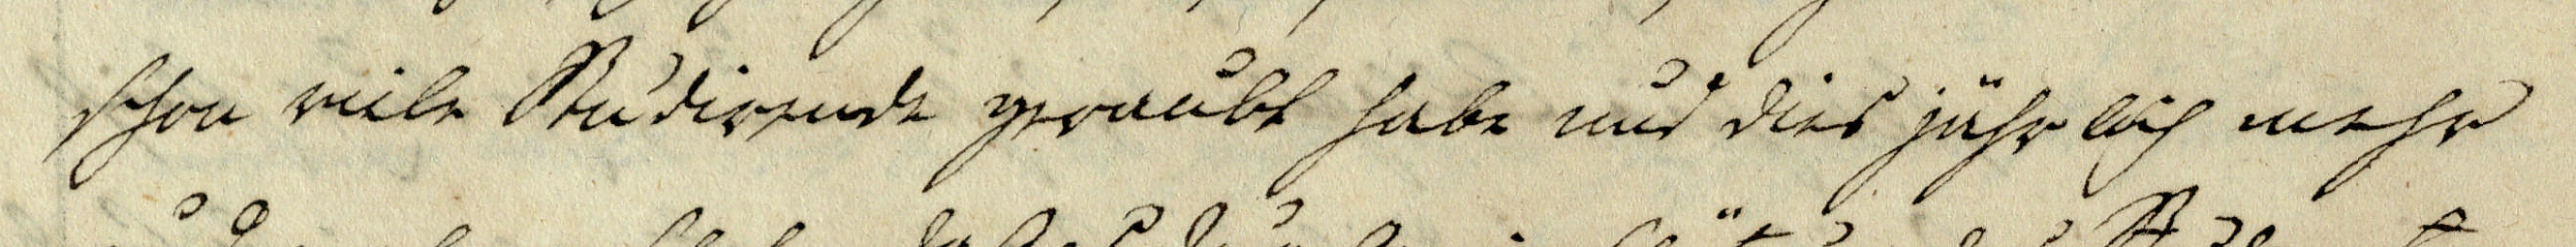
schon viele Studirende geraubt habe und dies jährlich mehr
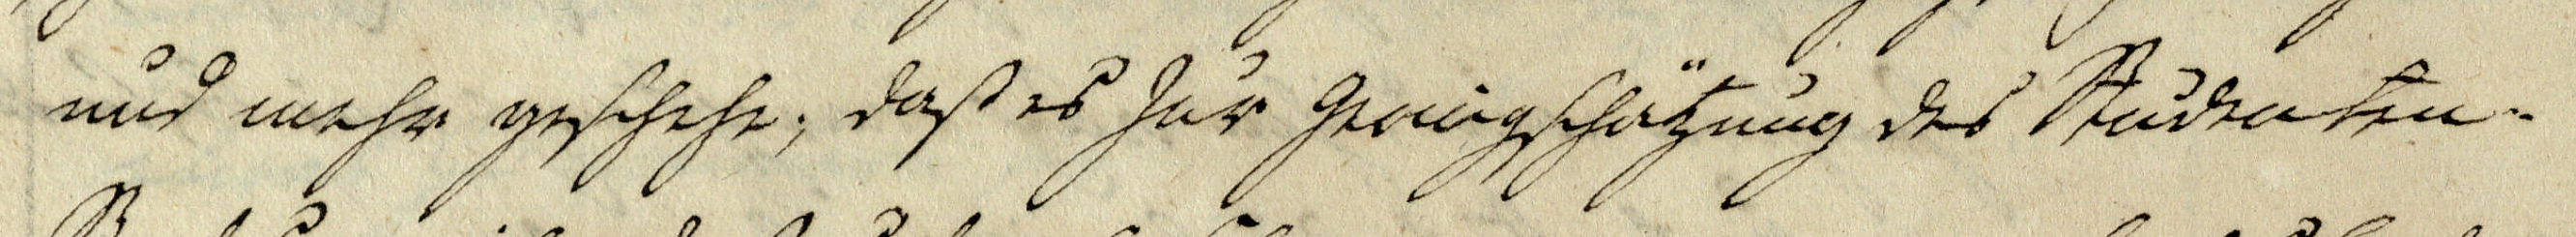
und mehr geschehe; daß es zur Geringschätzung des Studenten-
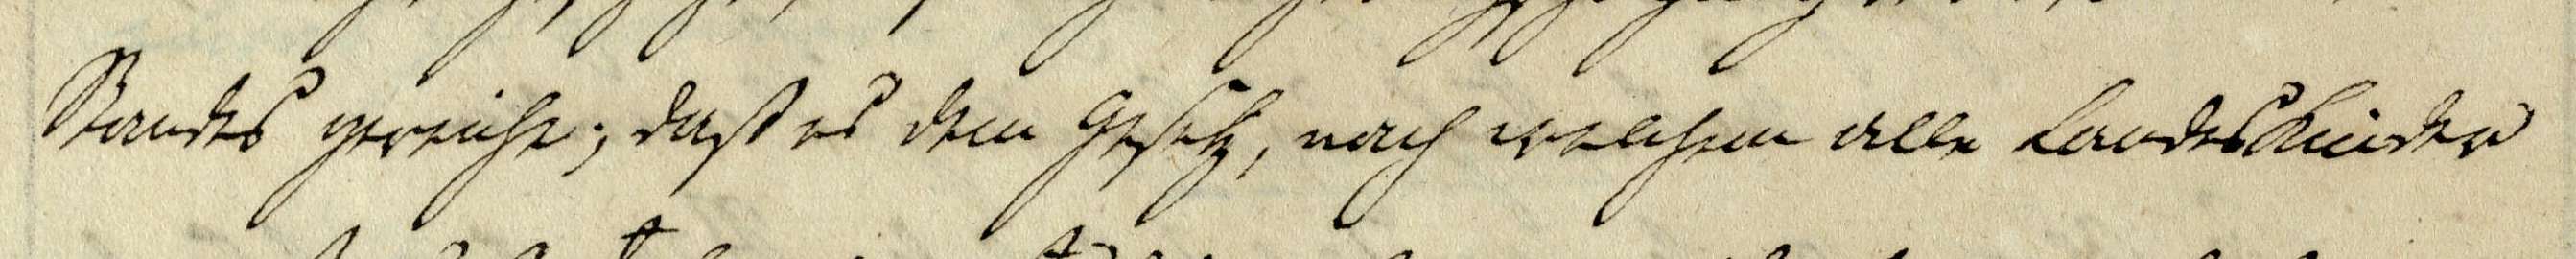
Standes gereiche; daß es dem Gesetz, nach welchem alle Landeskinder
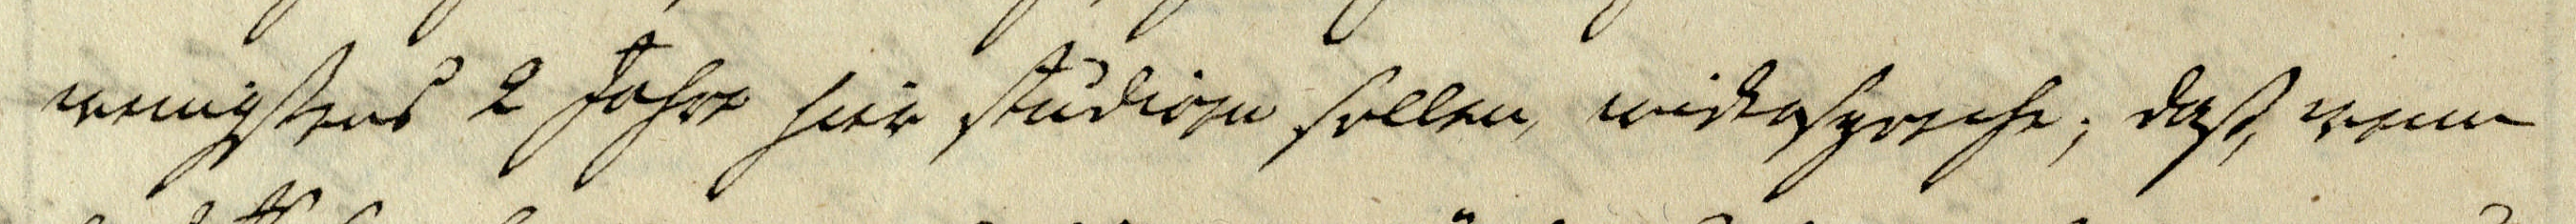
wenigstens 2 Jahre hier studiren sollen, widerspreche, daß, wenn
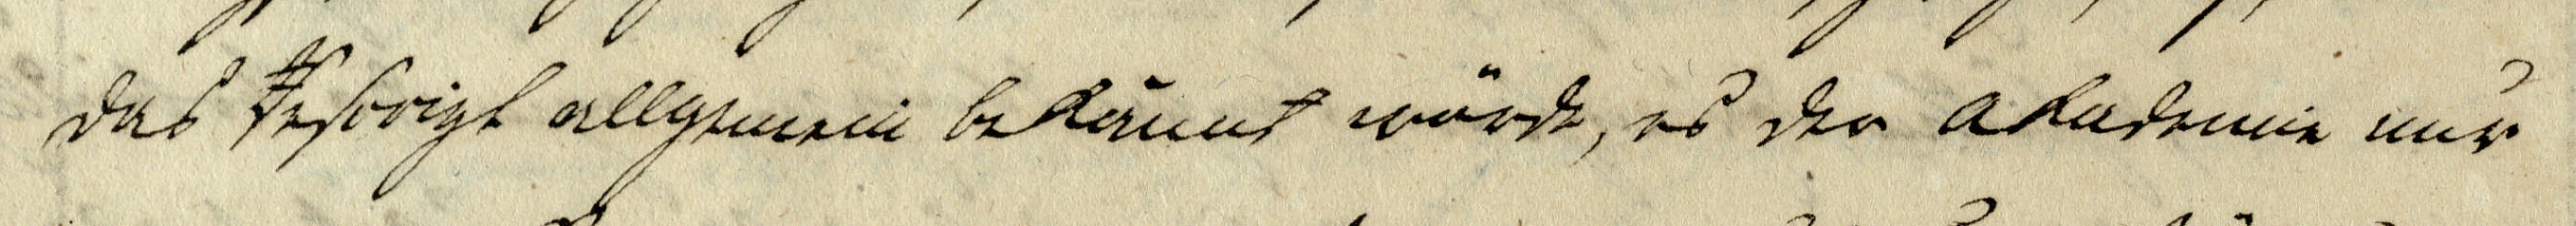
das Rescript allgemein bekannt würde, es der Akademie nur
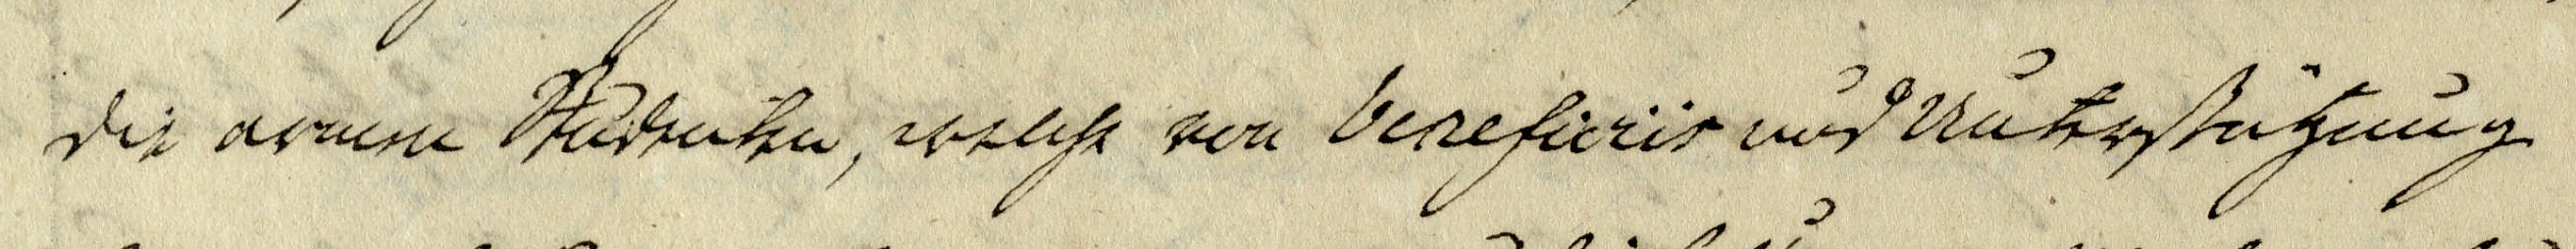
die armen Studenten, welche von beneficiis und Unterstützung
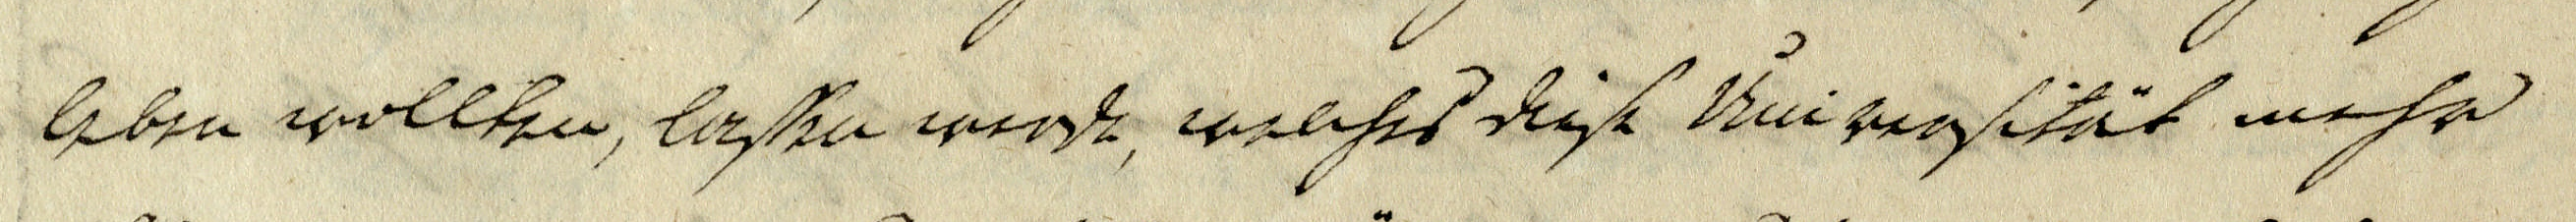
leben wollten, lassen werde, welches diese Universität mehr
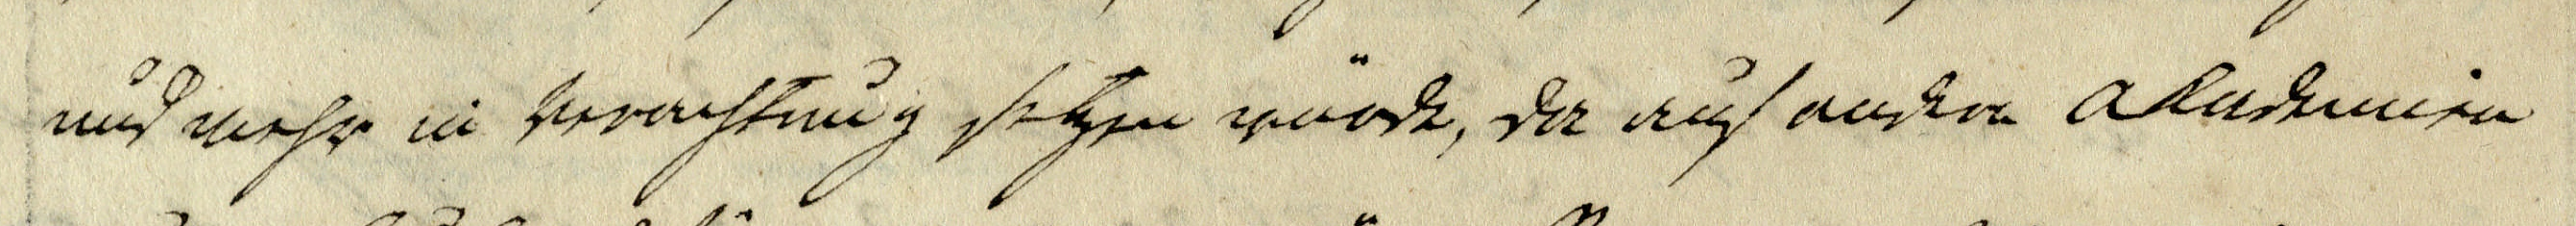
und mehr in Verachtung setzen würde, da auf andern Akademien
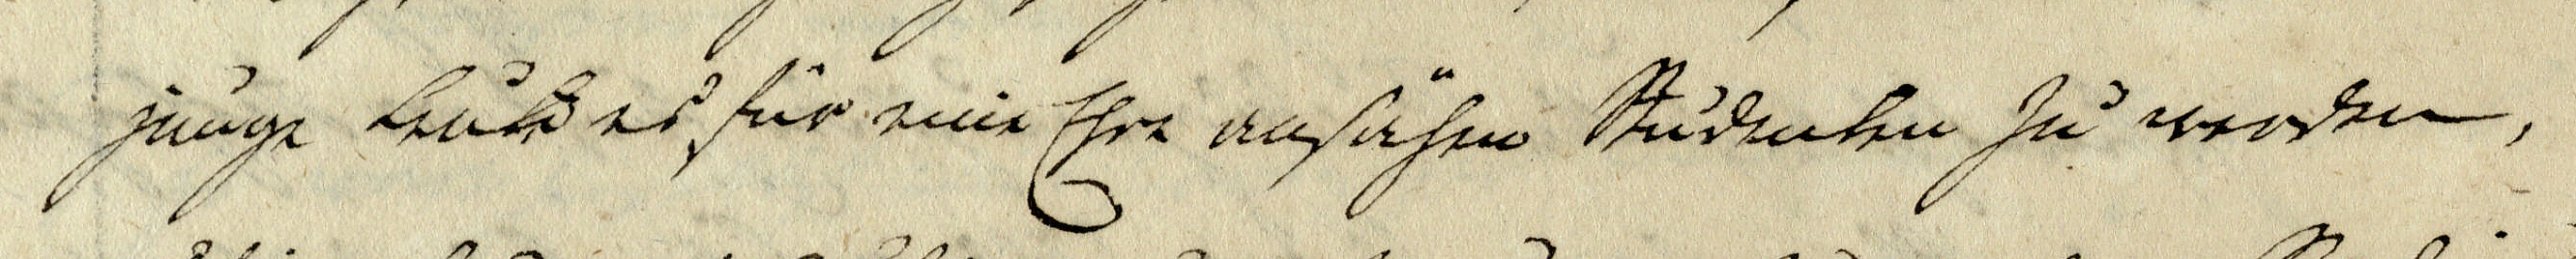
junge Leute es für eine Ehre ansehen Studenten zu werden,
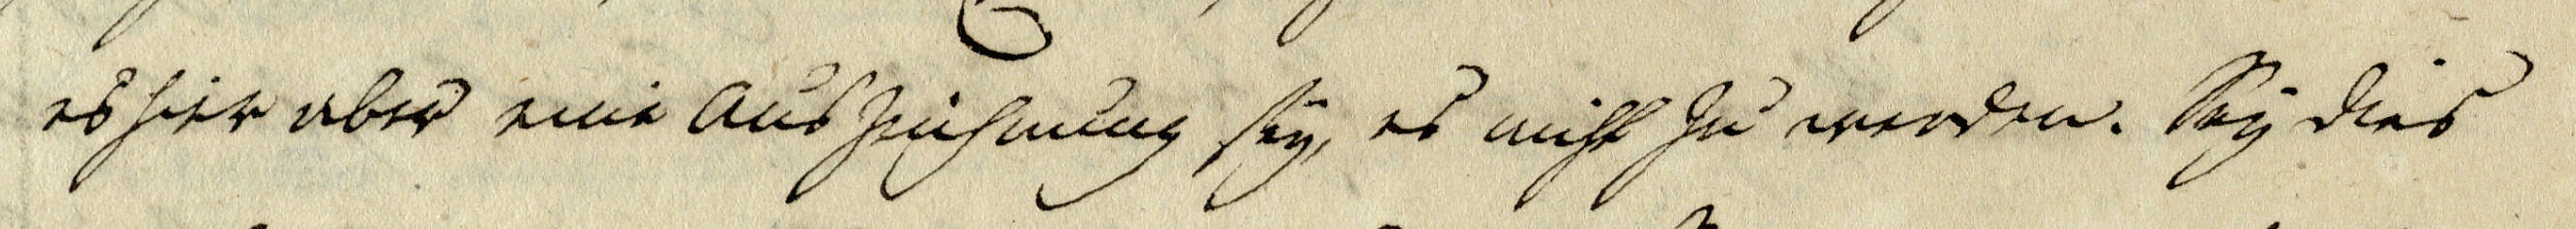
es hier aber eine Auszeichnung seÿ, es nicht zu werden. Seÿ dies
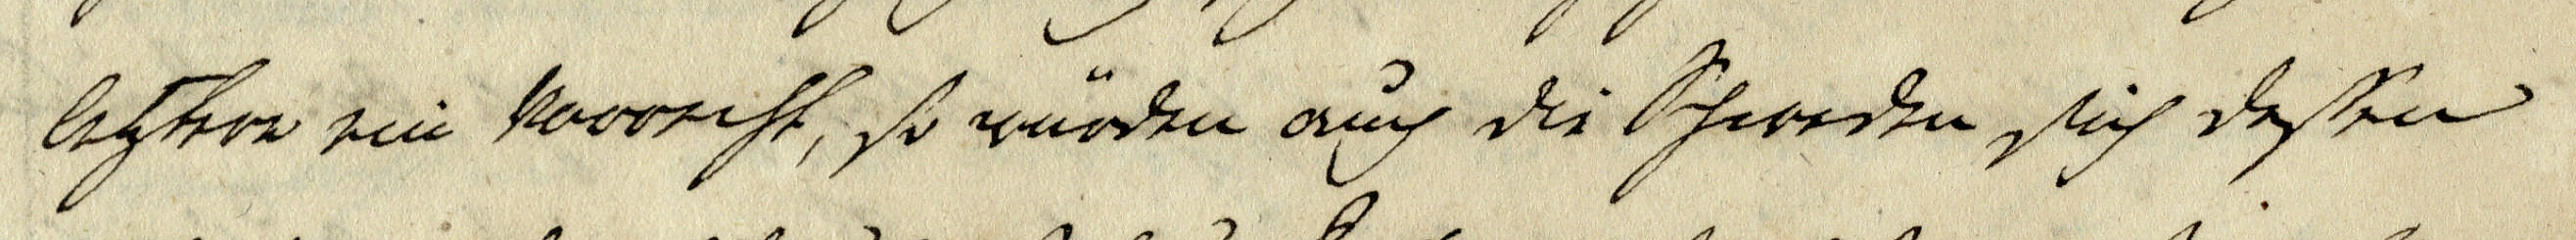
letztere ein Vorrecht, so würden auch die Schweden sich dessen
